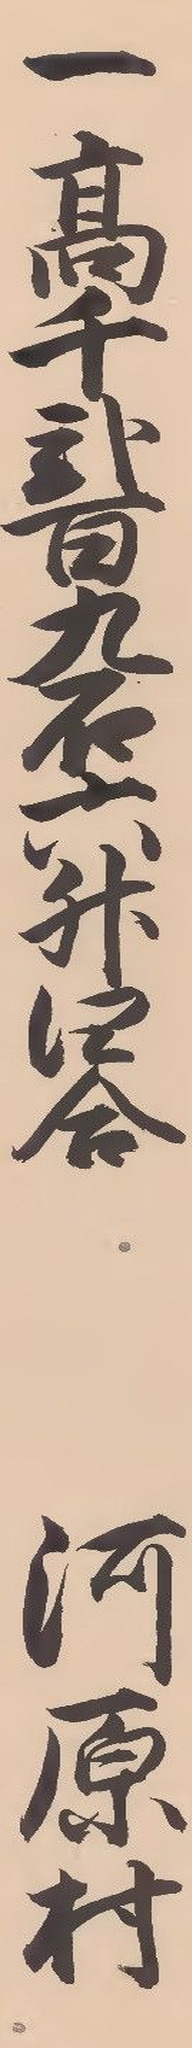一高千弐百九石六升四合河原村
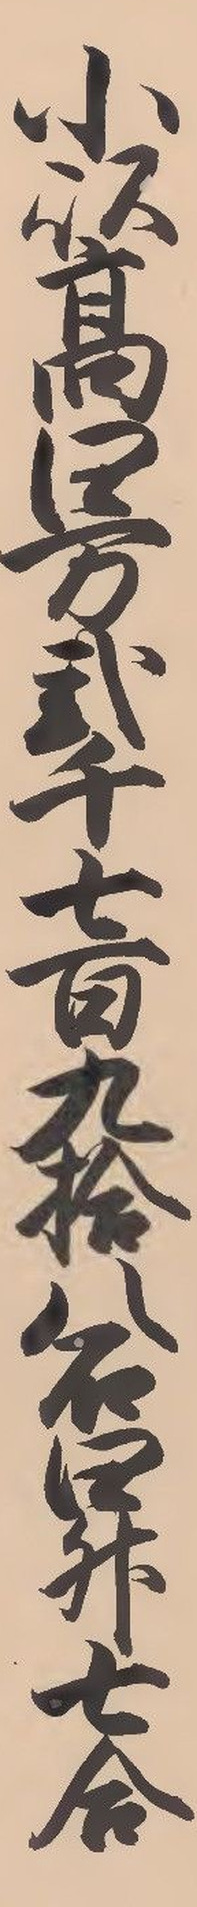小以高四万弐千七百九拾八石四升七合

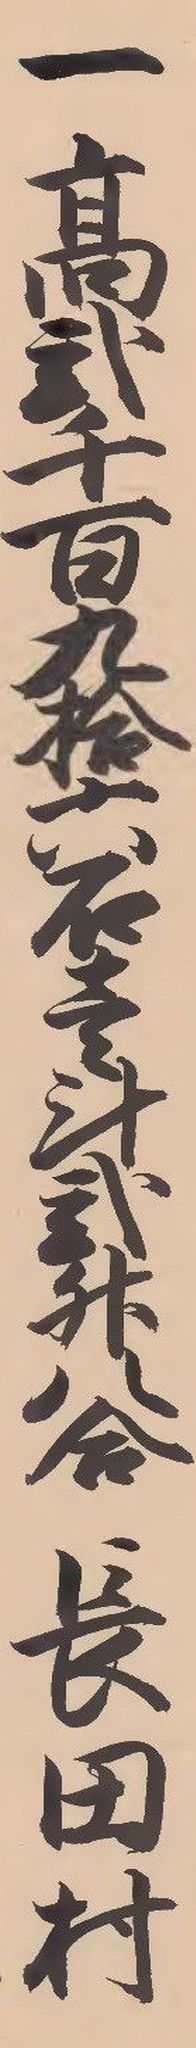一高弐千百九拾六石壱斗弐升八合長田村
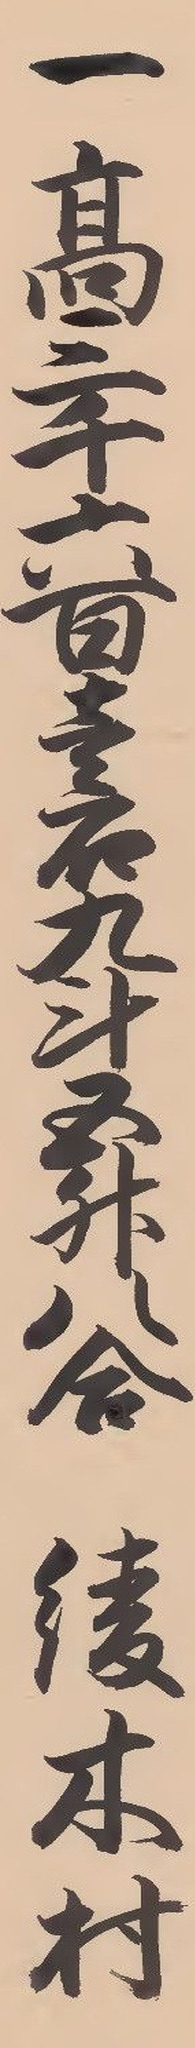一高三千六百壱石九斗五升八合綾木村
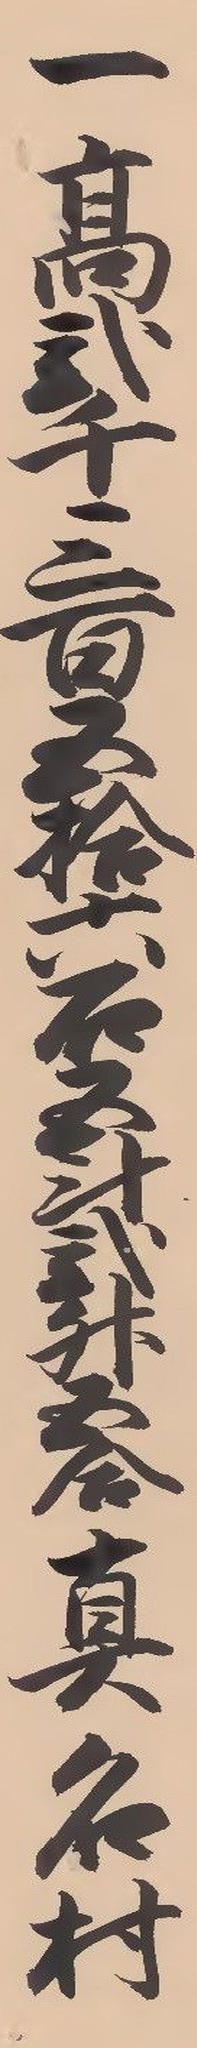一高弐千三百五拾六石五斗弐升五合真名村
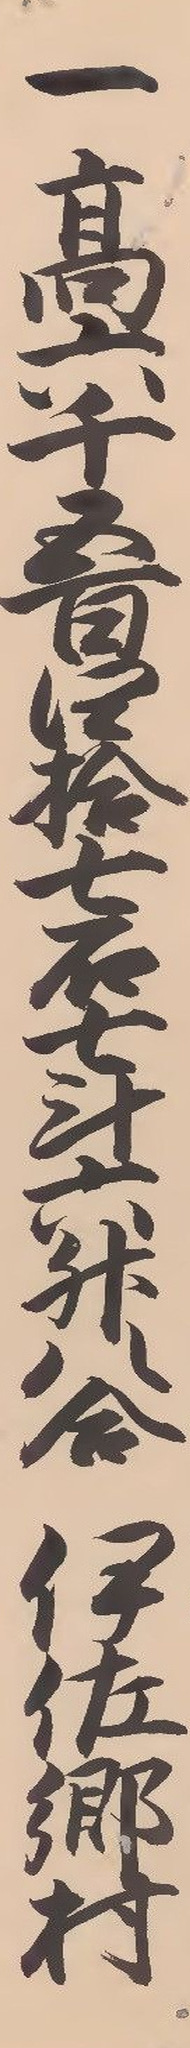一高六千五百四拾七石七斗六升八合伊佐郷村
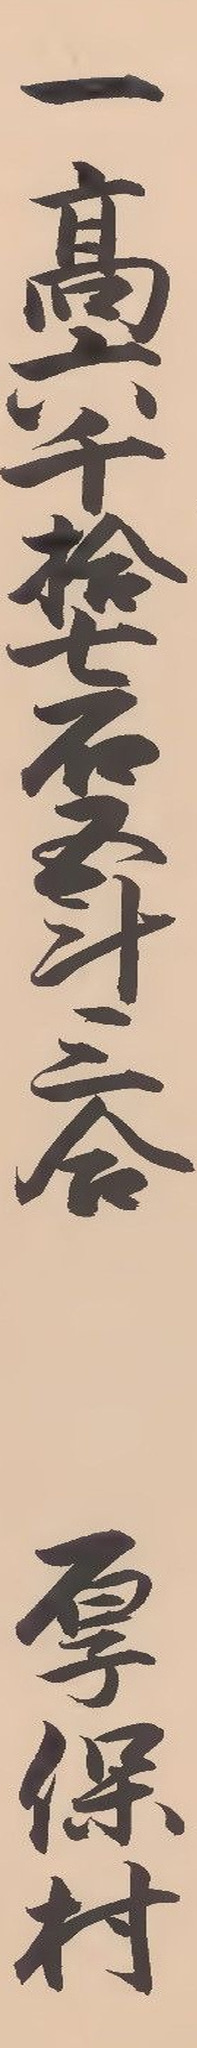一高六千拾七石五斗三合厚保村
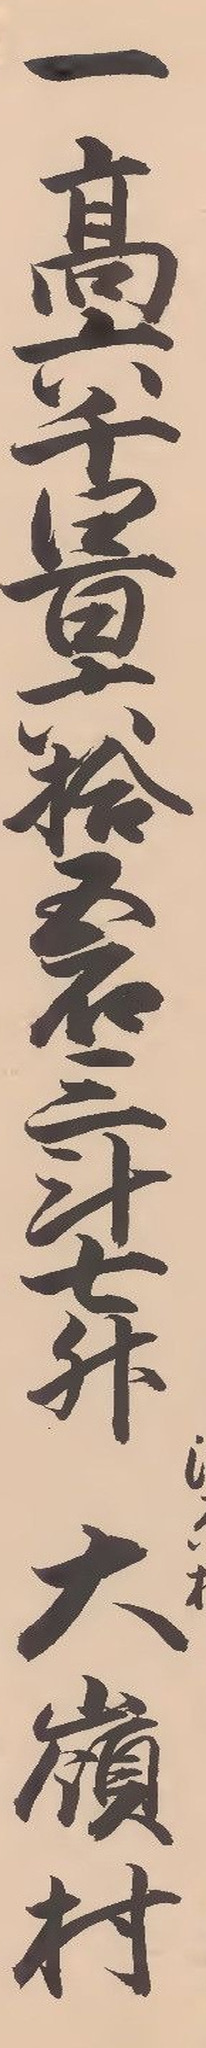一高六千四百六拾五石三斗七升大嶺村
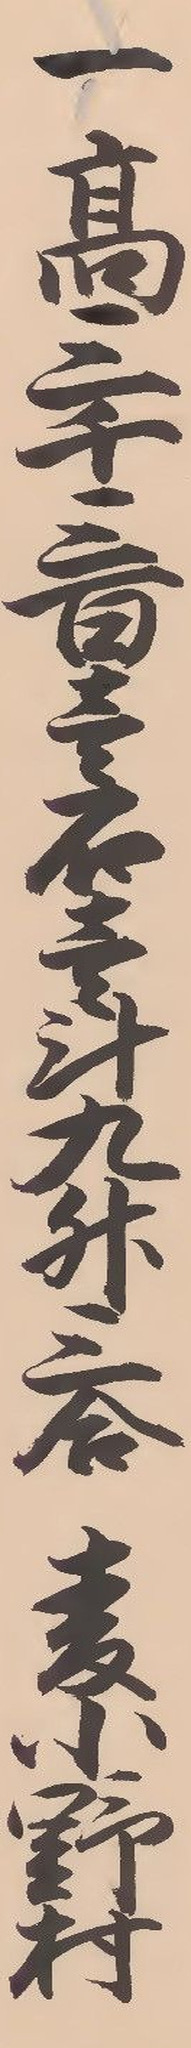一高三千三百壱石壱斗九升三合麦小野村

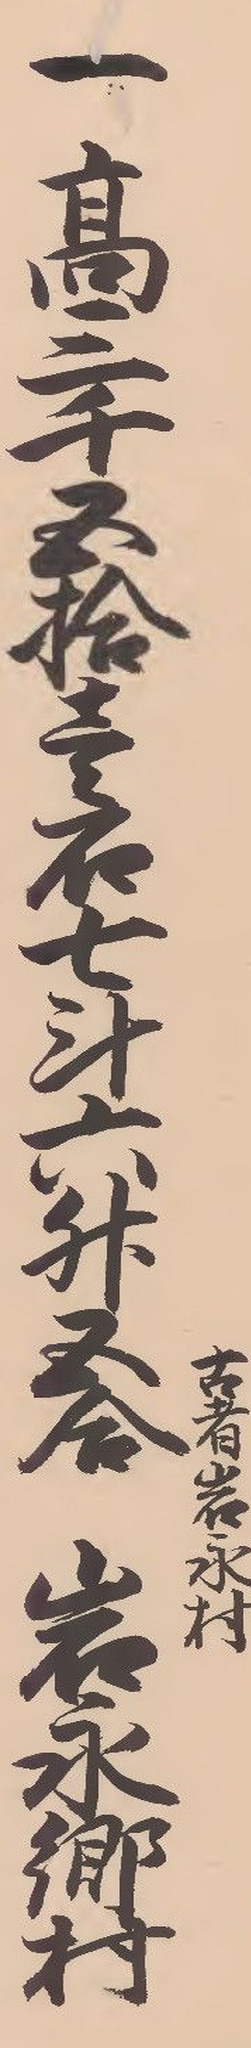一高三千五拾壱石七斗六升五合岩永郷村
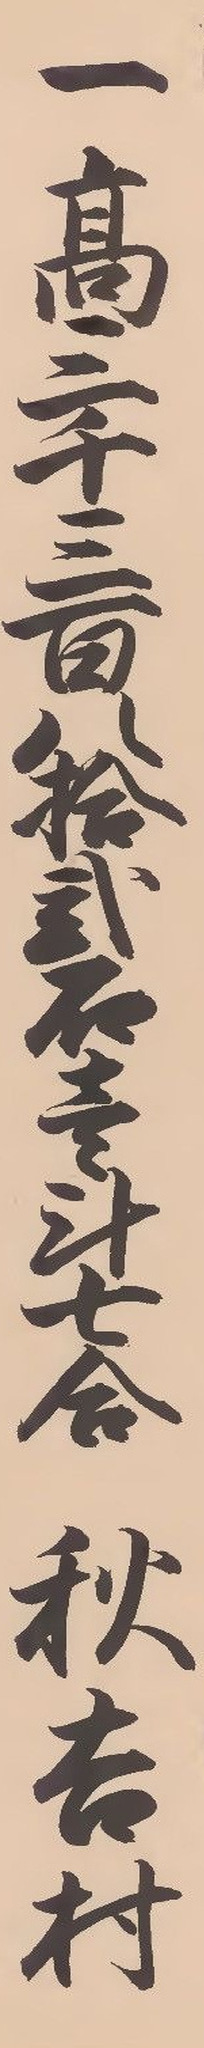一高三千三百八拾弐石壱斗七合秋吉村
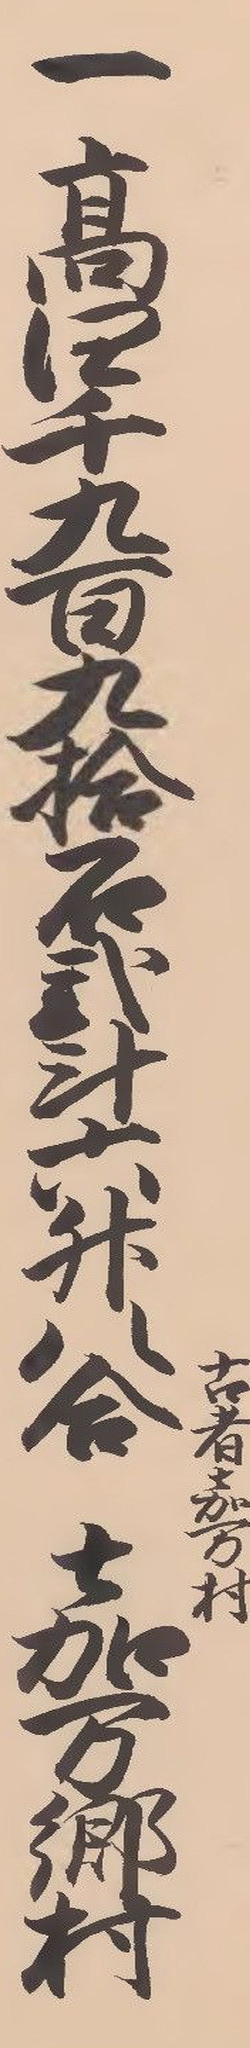一高四千九百九拾石弐斗六升八合嘉万郷村
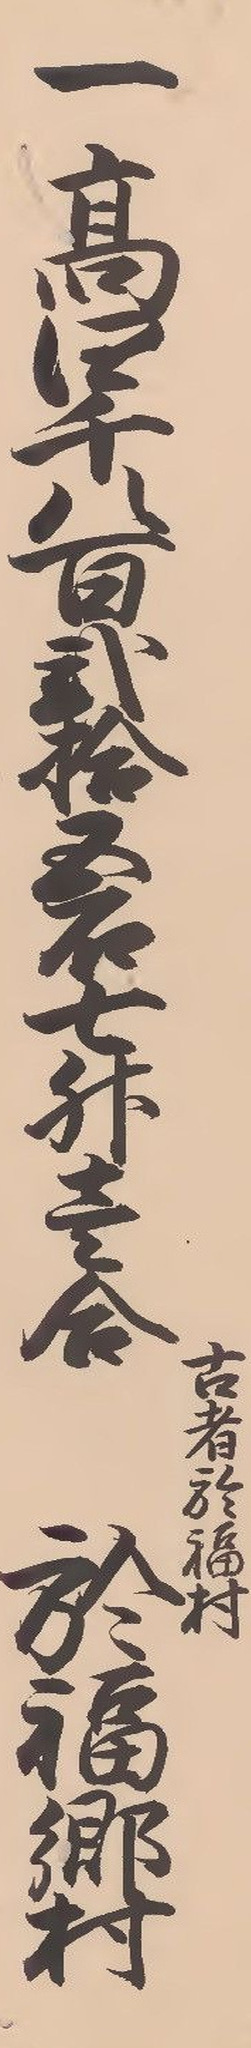一高四千八百弐拾五石七升壱合於福郷村
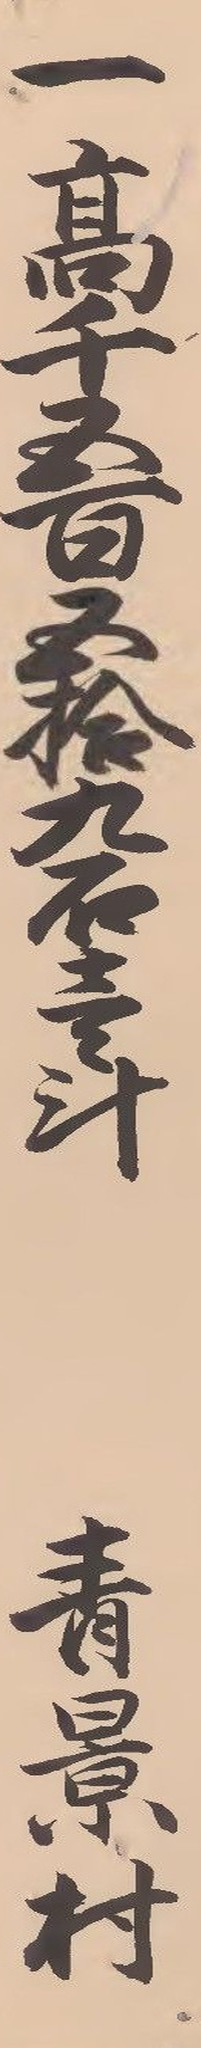一高千五百五拾九石壱斗青景村
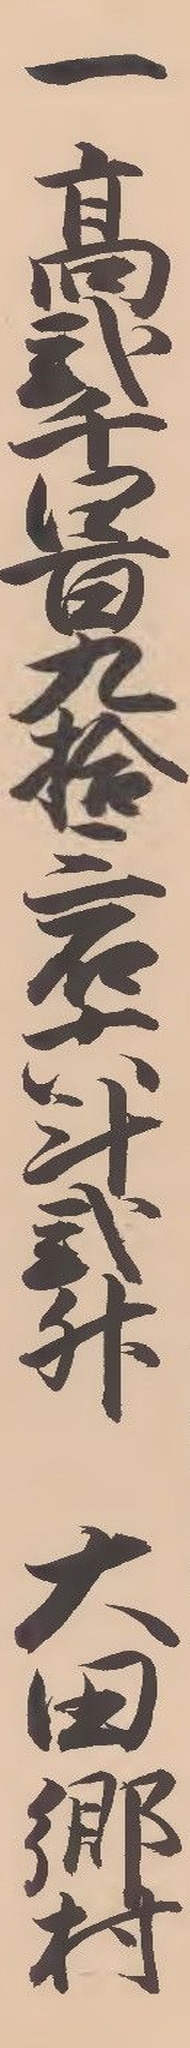一高弐千四百九拾三石六斗弐升大田郷村
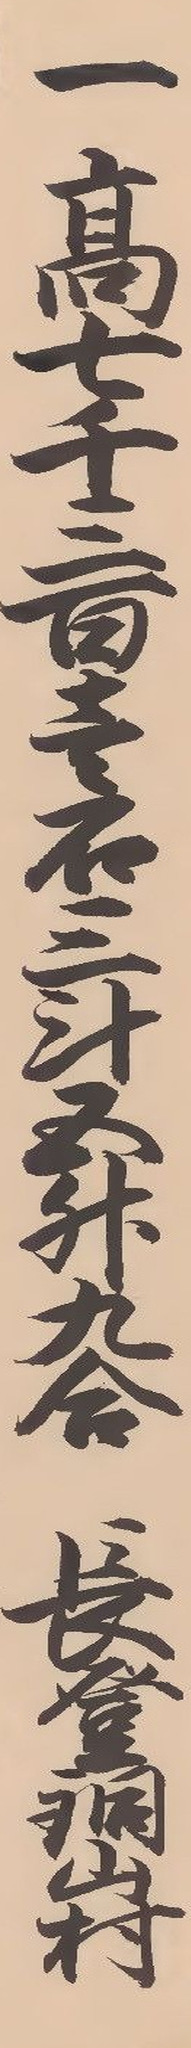一高七千三百壱石三斗五升九合長登銅山村
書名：長門国郷帳
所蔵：国立公文書館 National Archives of Japan
